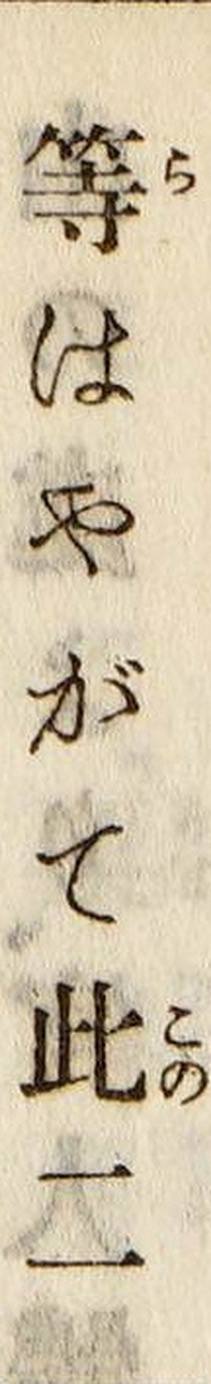等はやがて此二
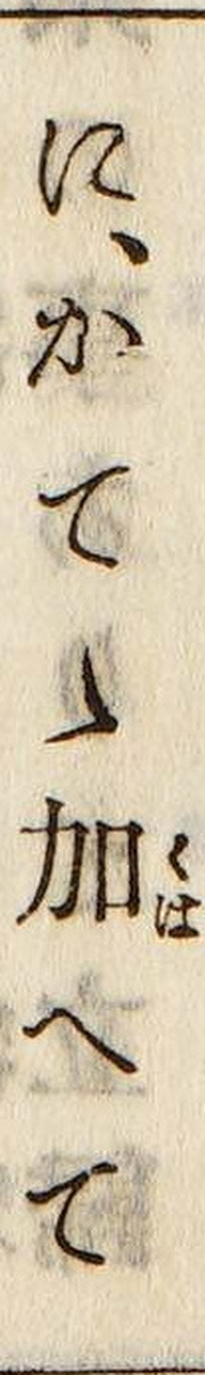に、かてゝ加へて
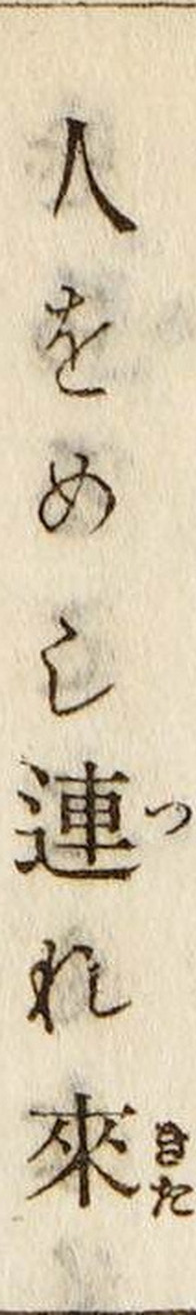人をめし連れ来
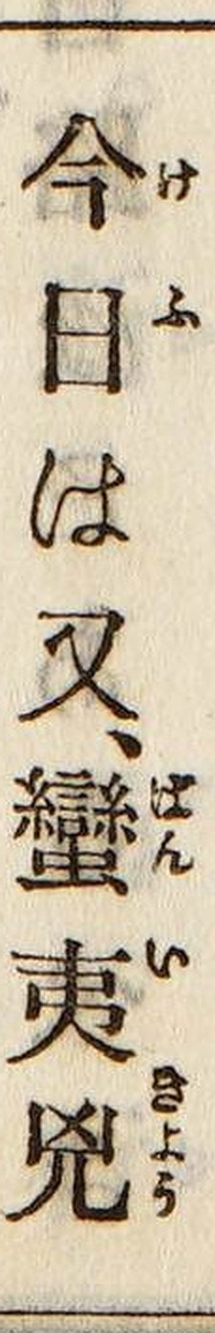今日は又、蛮夷兇
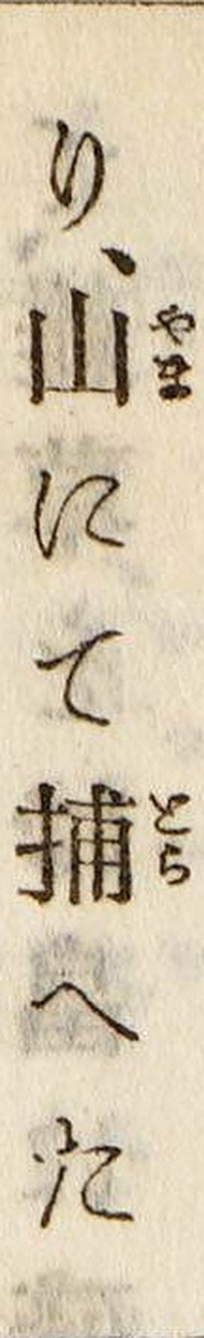り、山にて捕へた
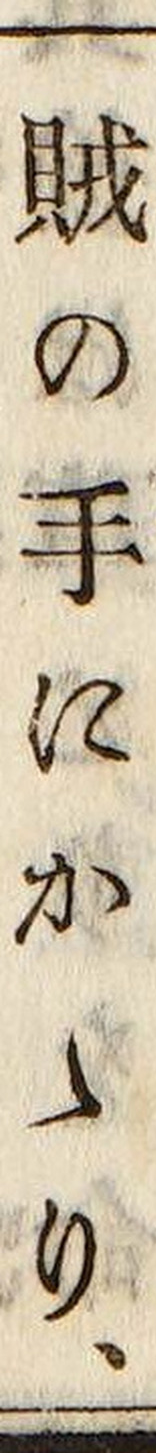賊の手にかゝり、
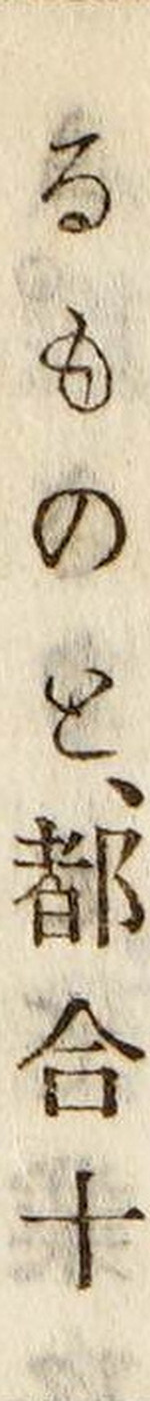るものと、都合十
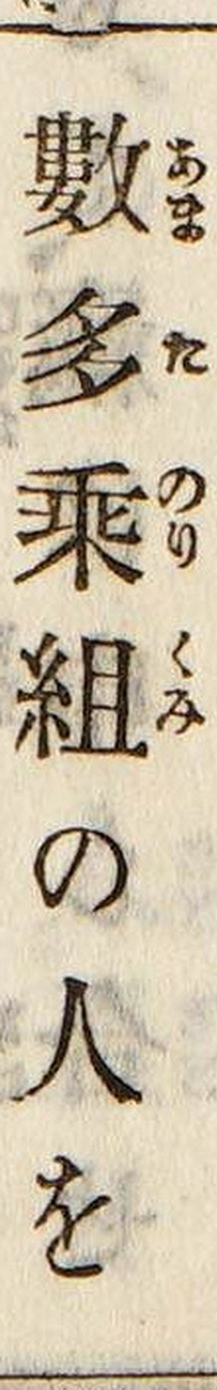数多乗組の人を
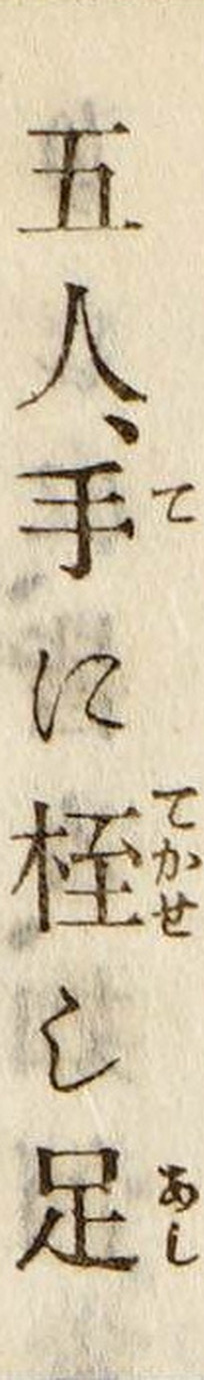五人、手に桎し足
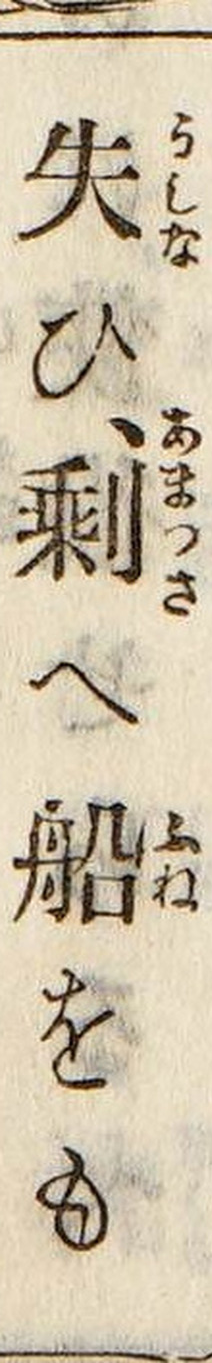失ひ、剰へ船をも
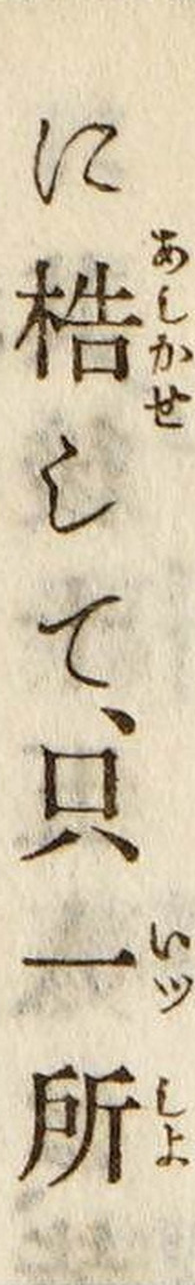に梏して、只一所
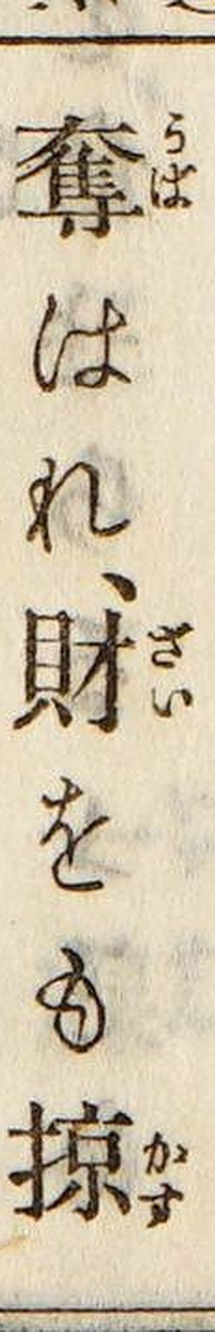奪はれ、財をも掠
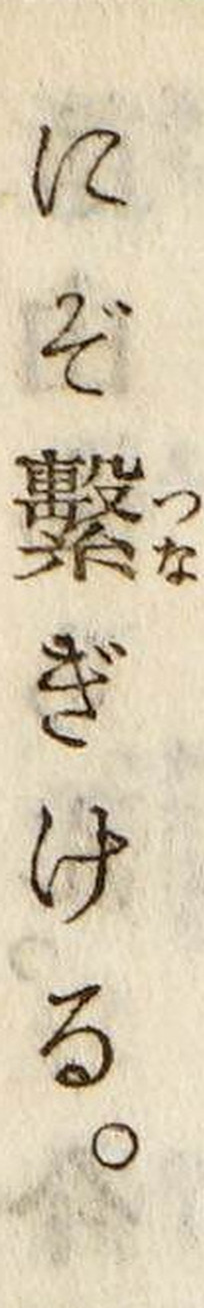にぞ繋ぎける。
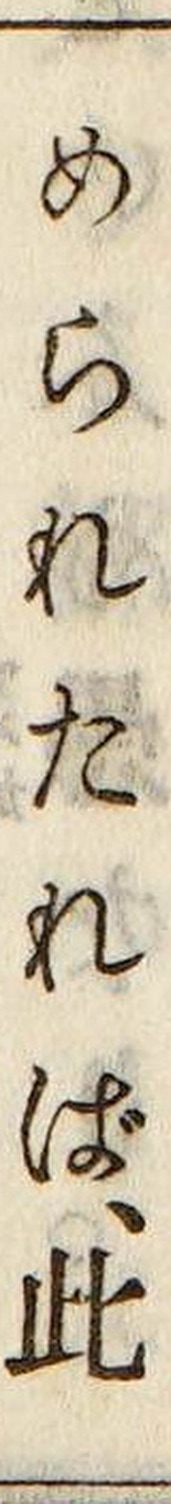められたれば、此
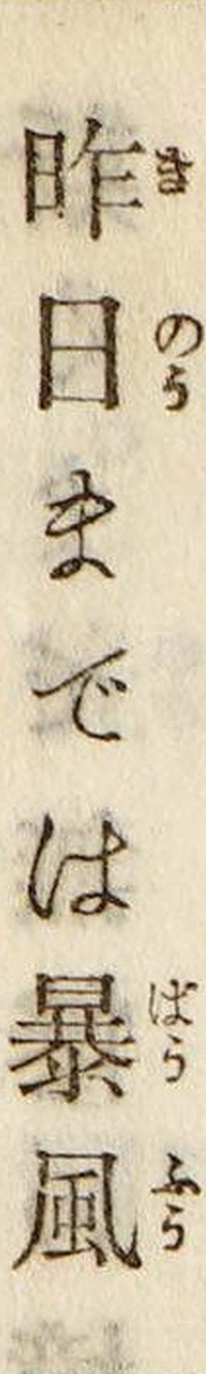昨日までは暴風
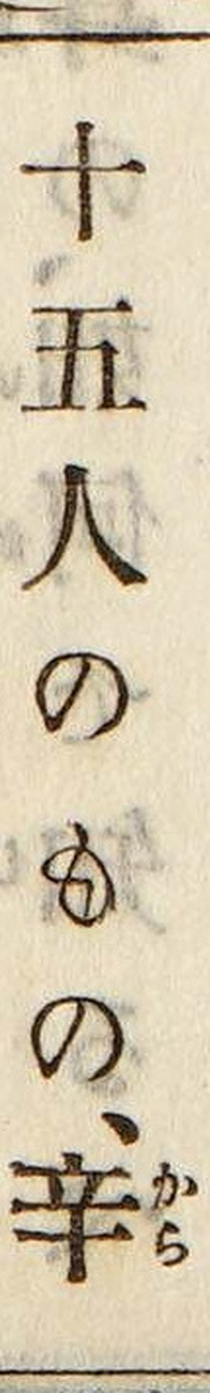十五人のもの、辛
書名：日本漂流譚
